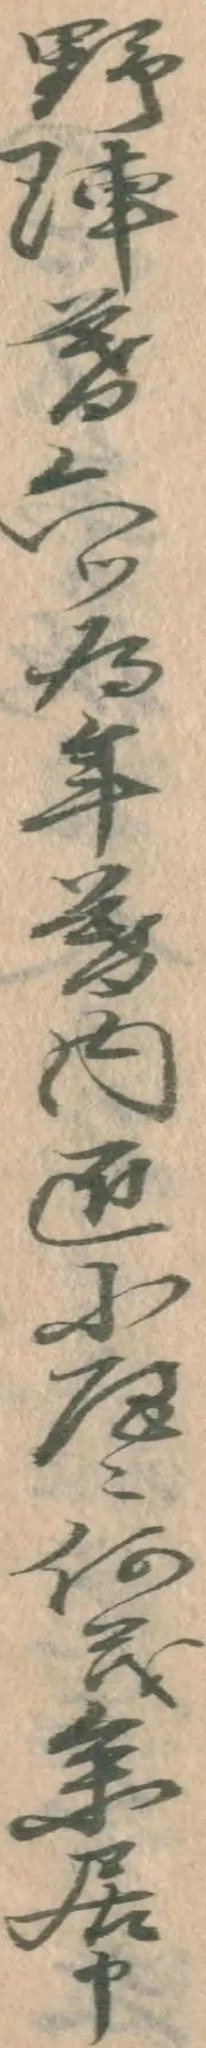野陣暮六つ為年暮内匠小屋に何茂参居申
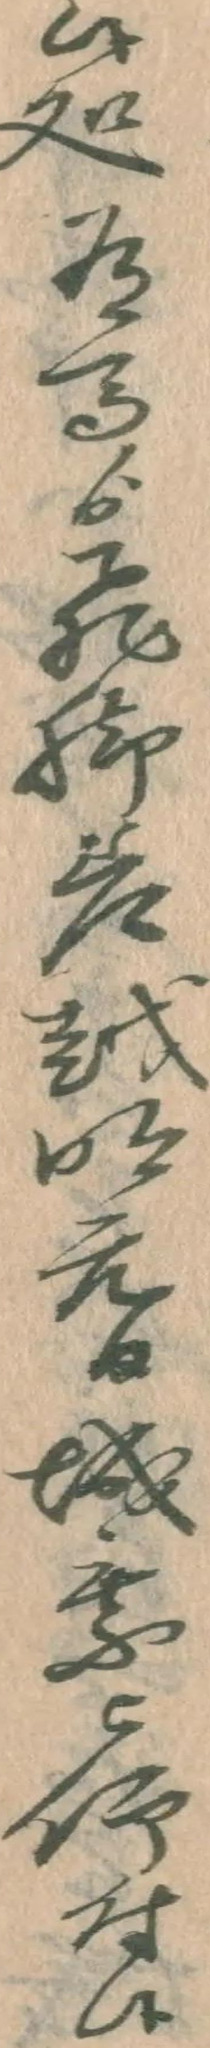候処有馬ゟ飛騨差越明元日城乗被仰付候
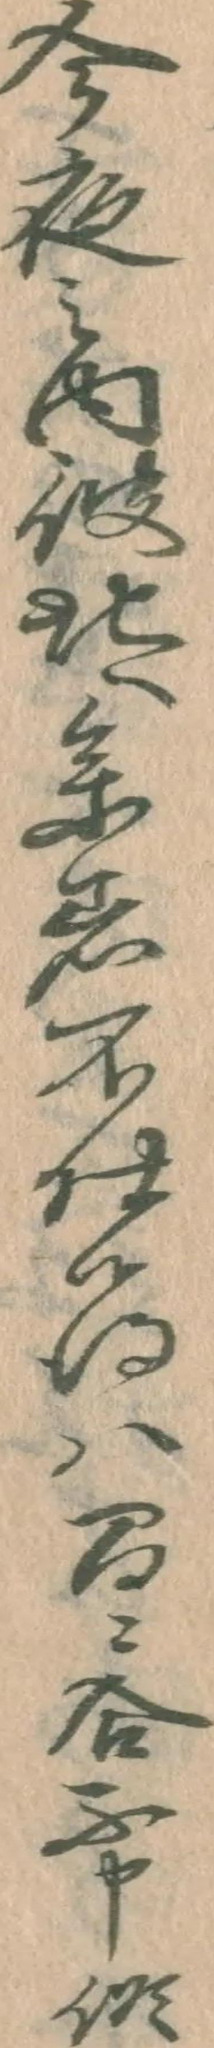今夜之内彼地へ参着不仕候得は間に合ふ申候
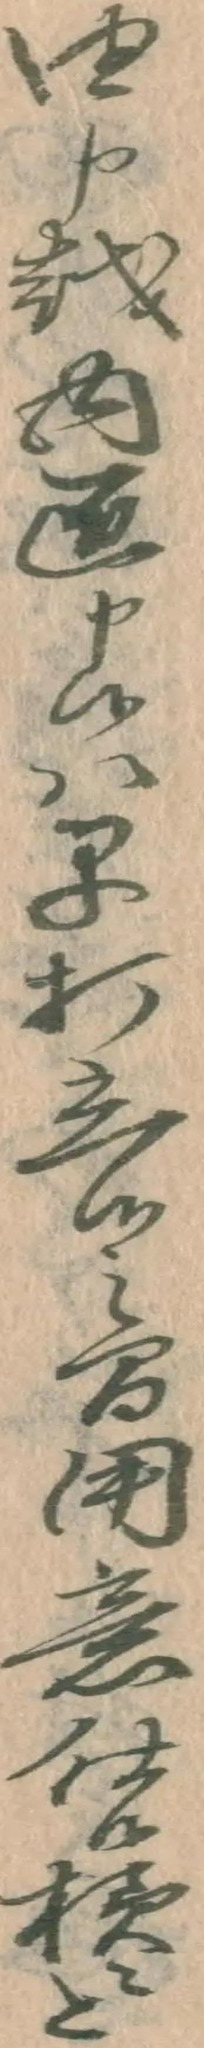由申越内匠申候は早打立候之間用意仕候様にと
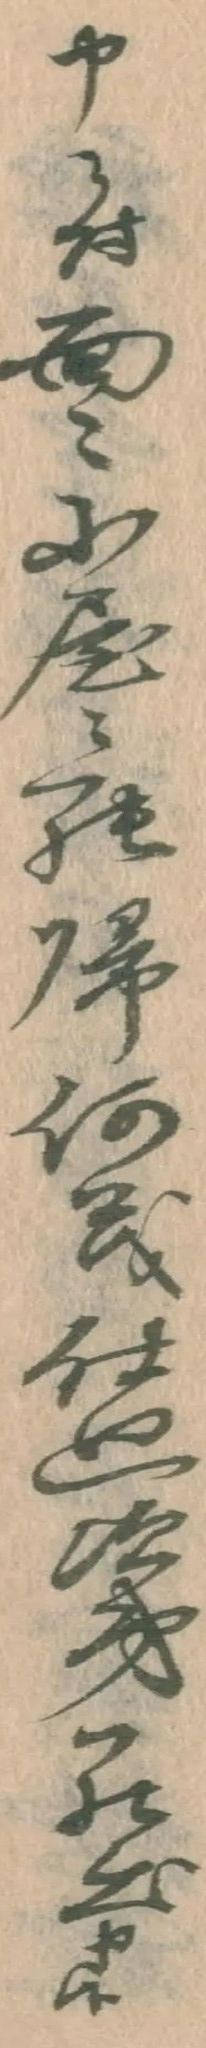申に付面々小屋に罷帰何茂仕廻次第罷出申候
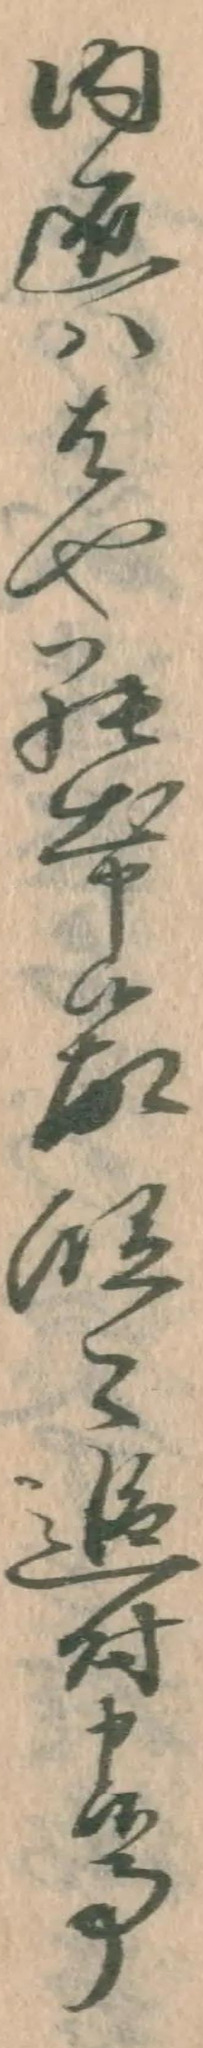内匠は者や罷出申候故段々追付申候事
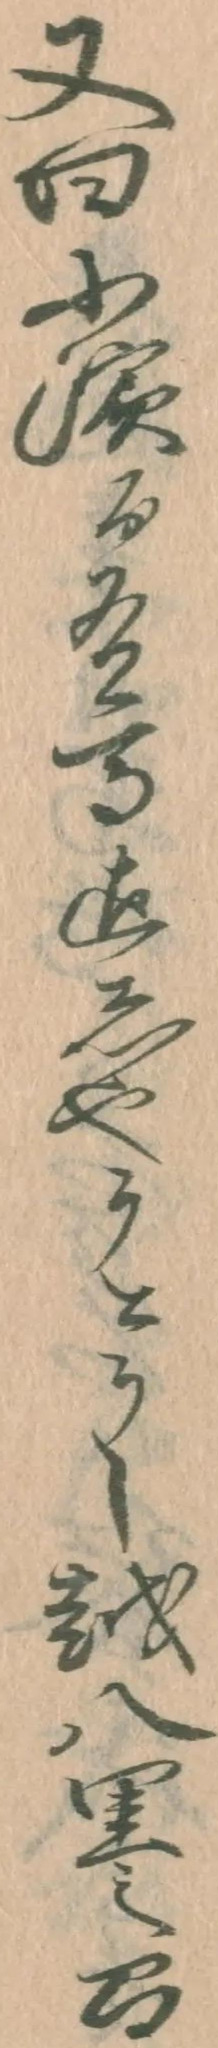又曰小浜ゟ有馬迄志やうとうし越八里之間
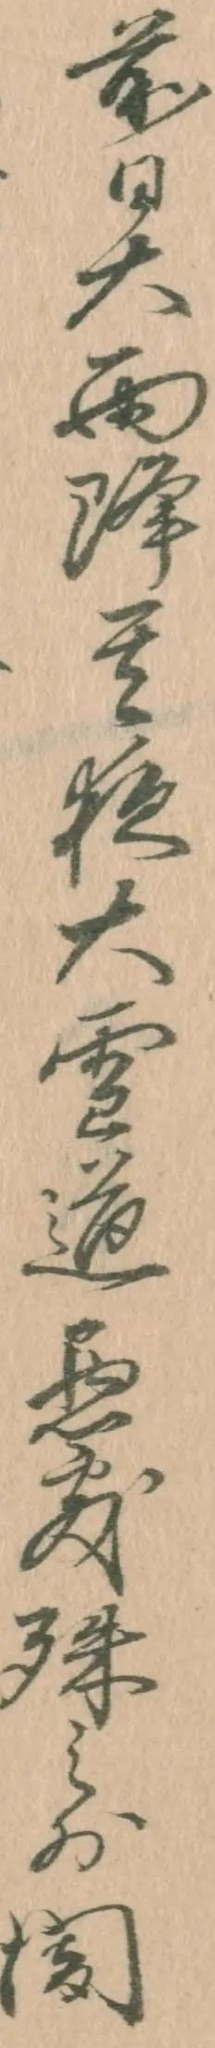前日大雨降其夜大雪道悪敷殊之外闇
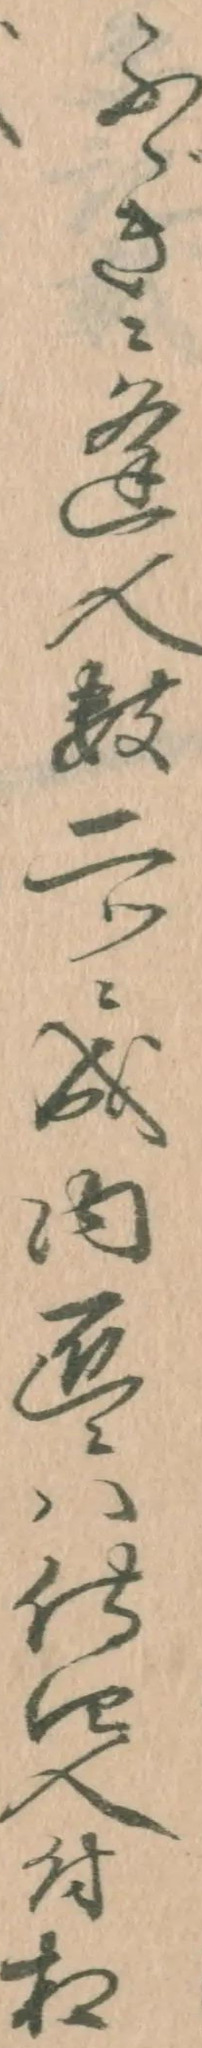ふゞきに逢人数二つに成内匠には侍四人付相
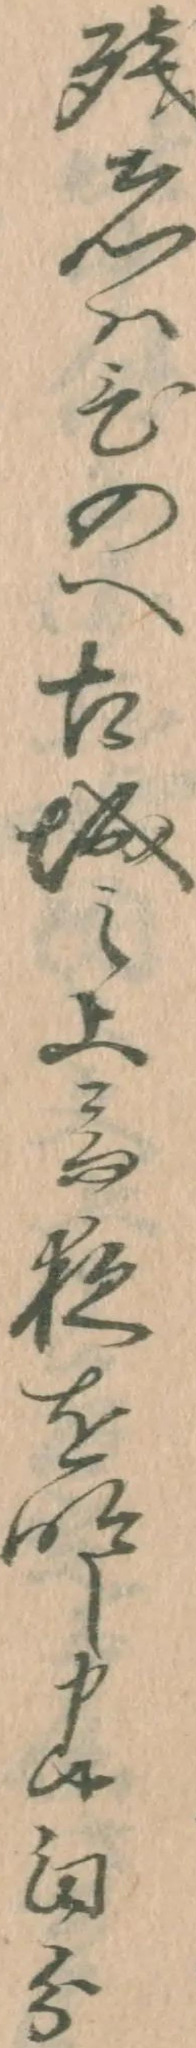残者はものへ古城之上に而夜を明し申候自分
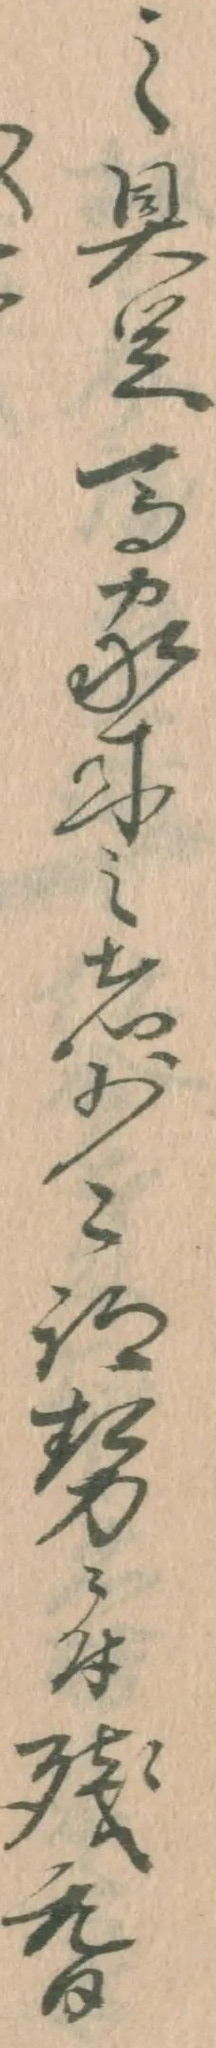之具足馬家来之者少々跡勢に付残元日
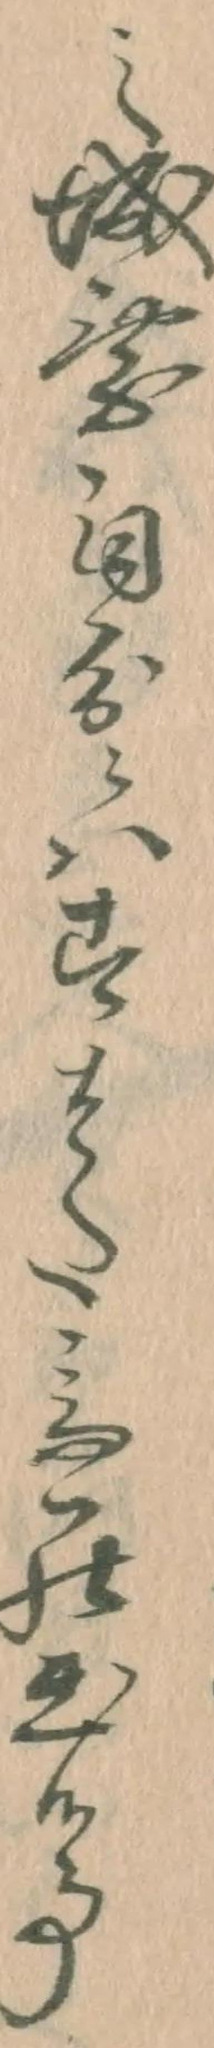之城乗自分には春者たに而罷出候事
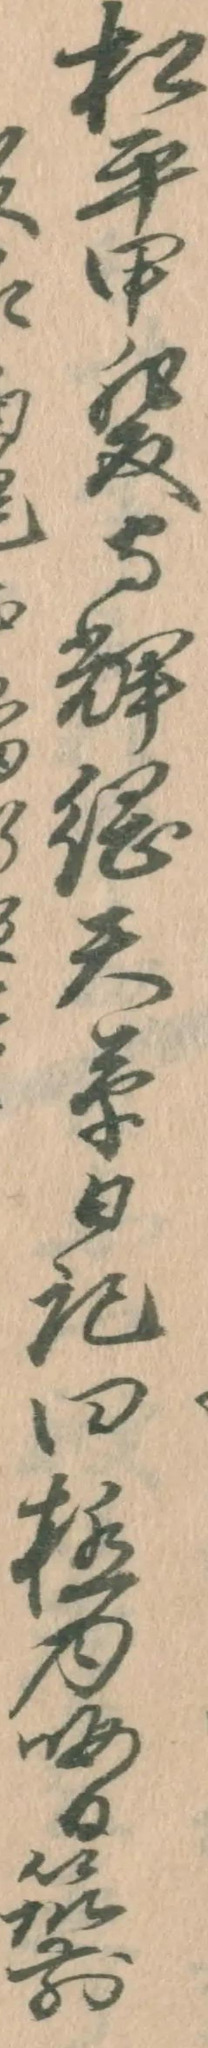松平甲斐守輝綱天草日記曰極月晦日筑前
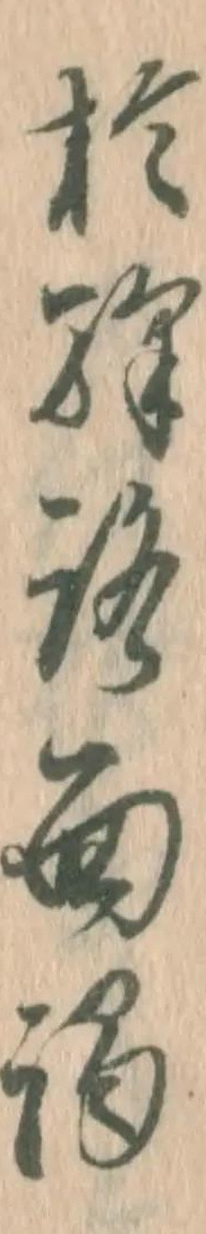於驛路面謁

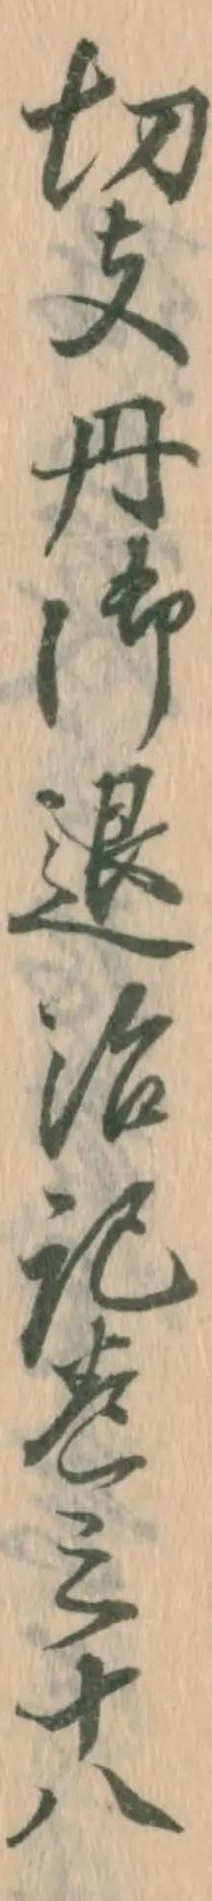切支丹御退治記巻之十八
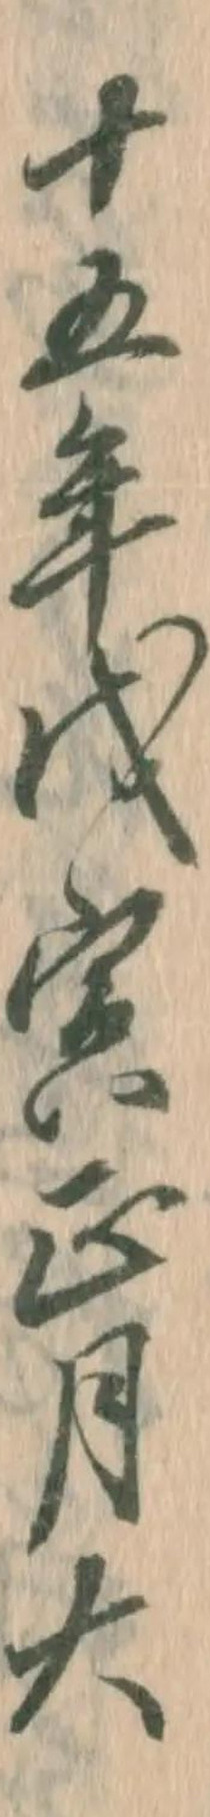十五年戌寅正月大
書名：切支丹御退治記 49巻. [5]
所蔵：国立国会図書館 National Diet Library, JAPAN
